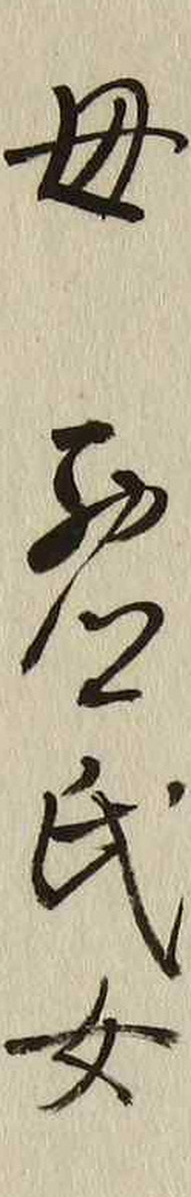母西郷氏女
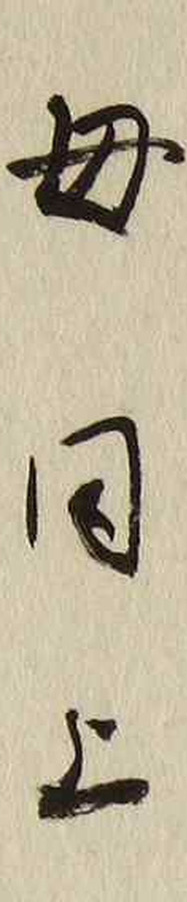母同上

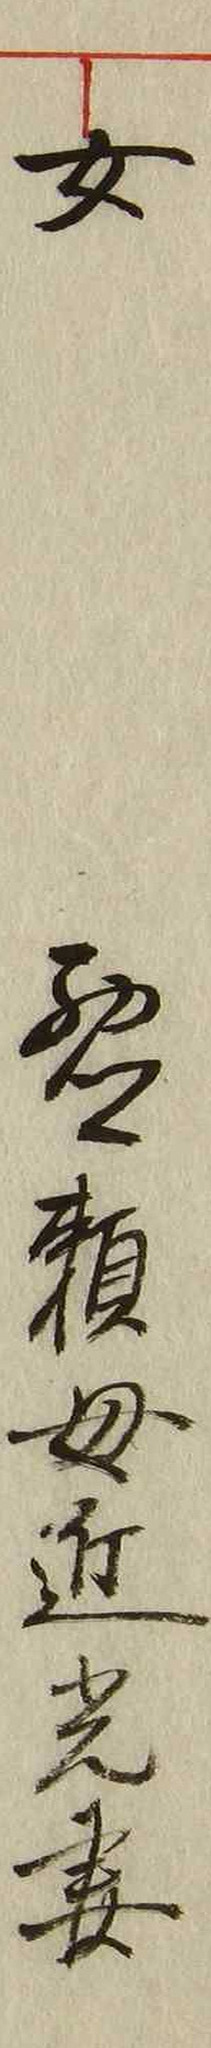女西郷頼母近光妻
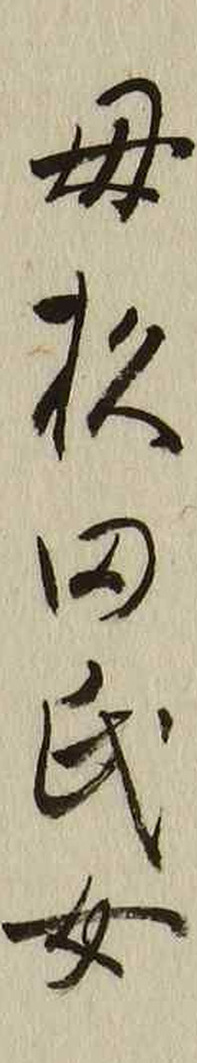母杉田氏女
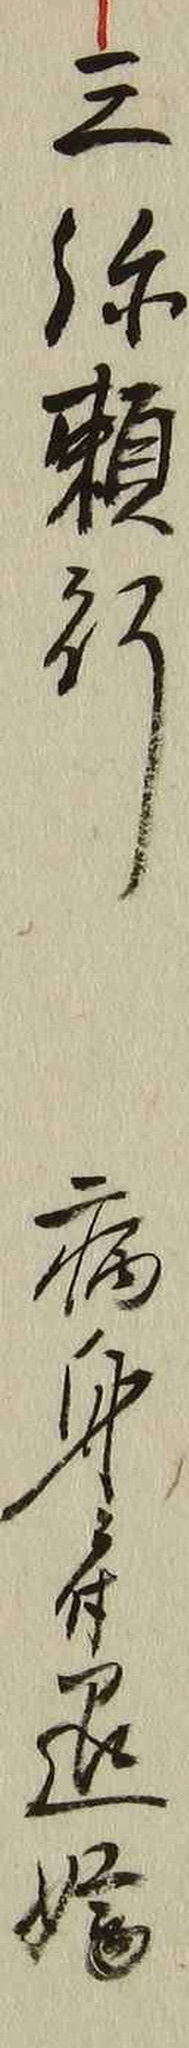三弥頼行病身ニ付退嫡
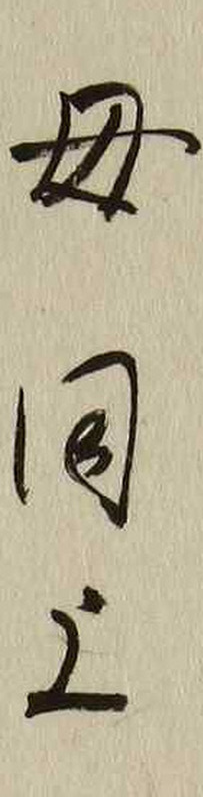母同上
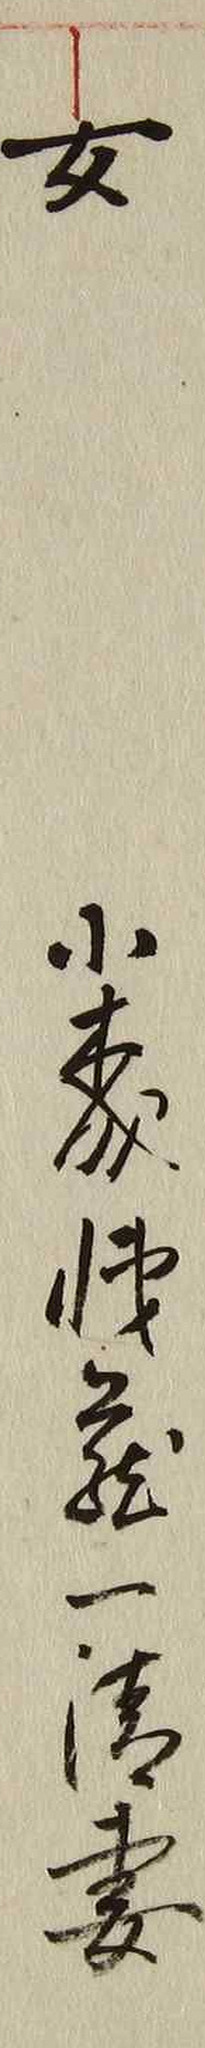女小森悌蔵一清妻
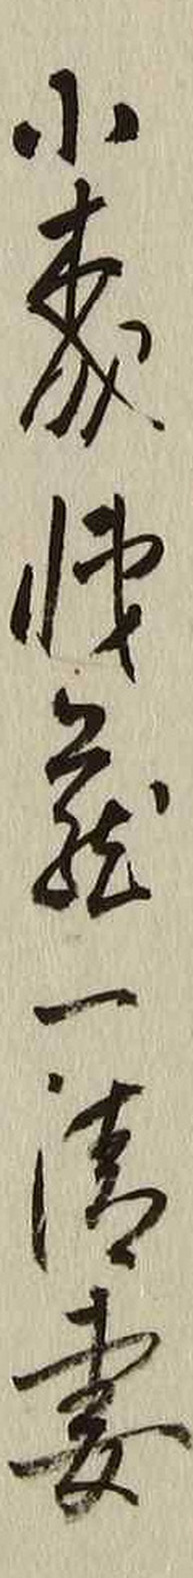女小森悌蔵一清妻
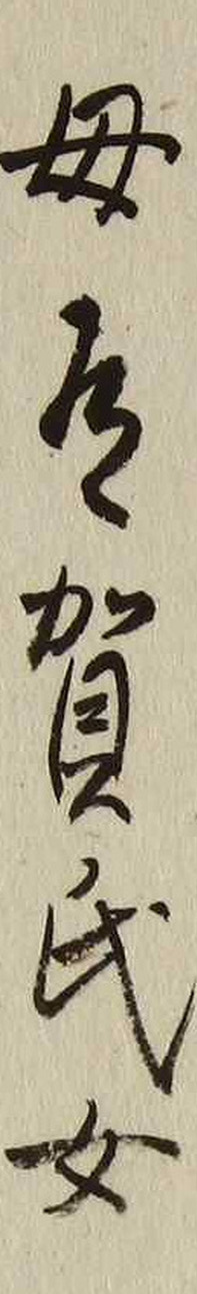母有賀氏女
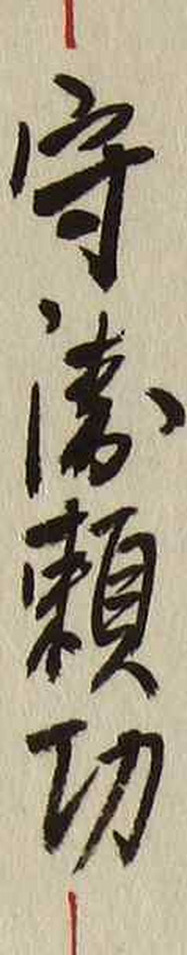守衛頼功
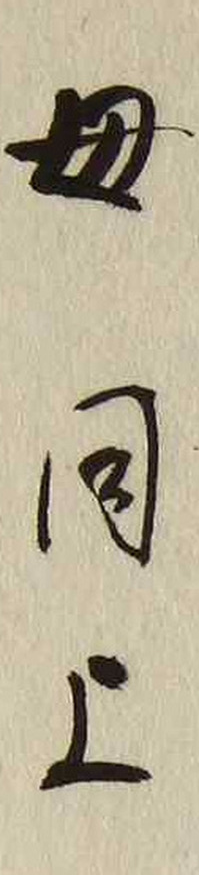母同上

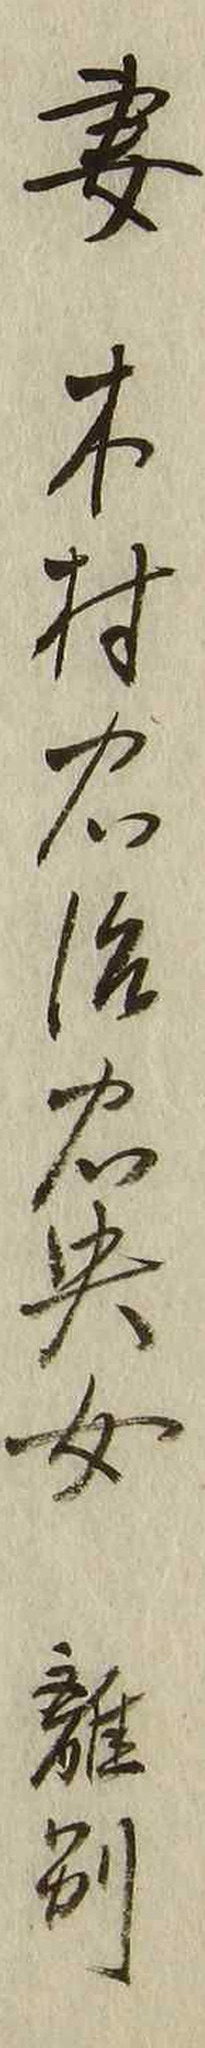妻木村忠治忠央女離別
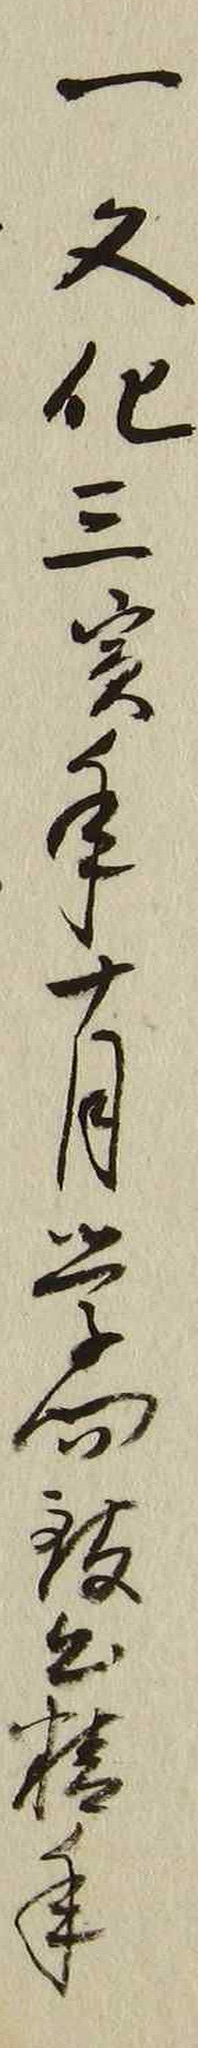一文化三寅年十月学問致出精年
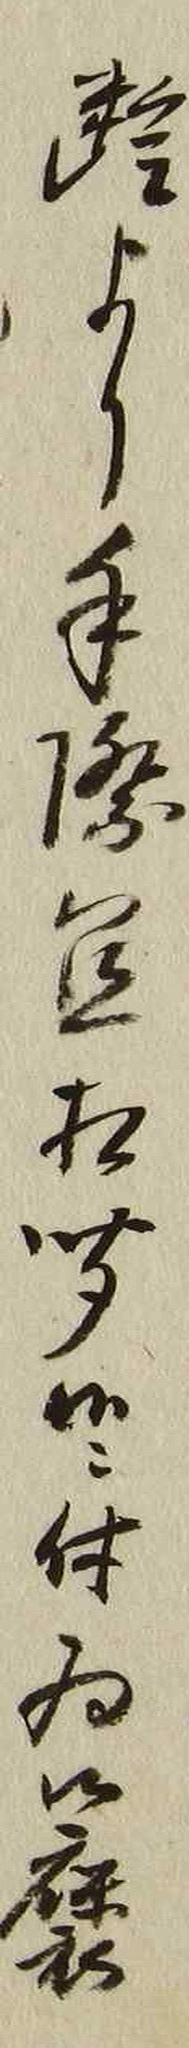齢より手際宜相聞候ニ付為御褒
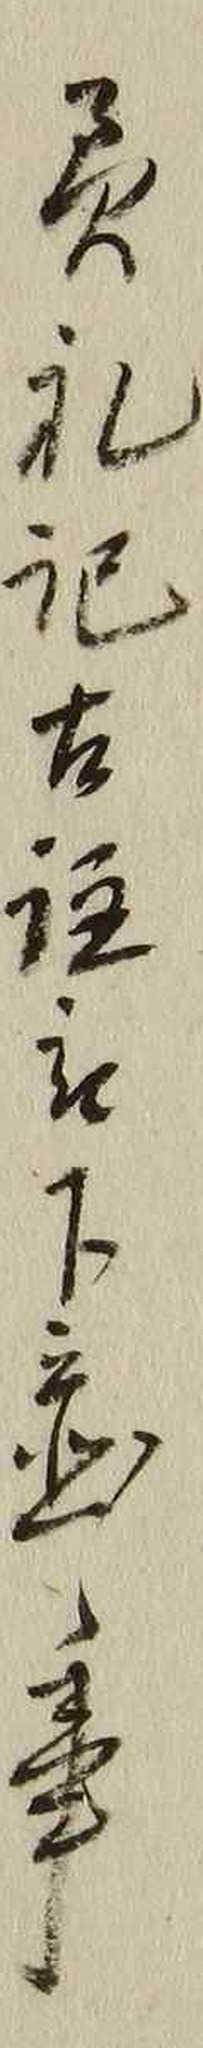美礼記古註被下置候事
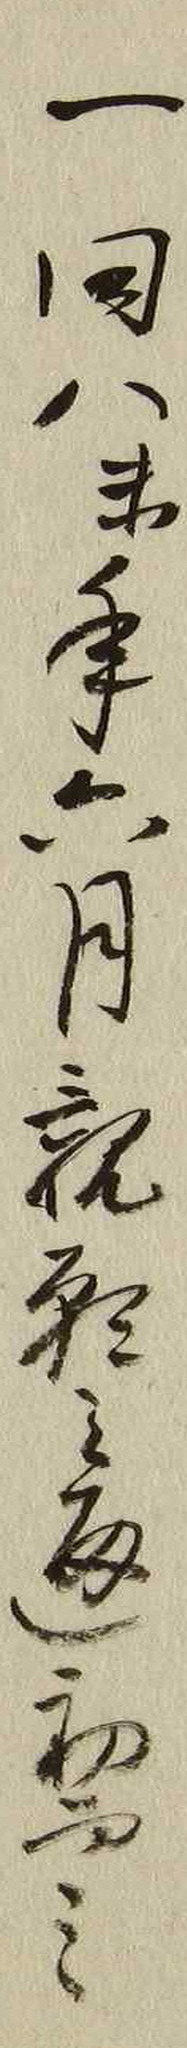一同八未年六月親願之通初而之
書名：諸士系譜　巻之351　す之部1
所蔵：会津若松市立会津図書館
